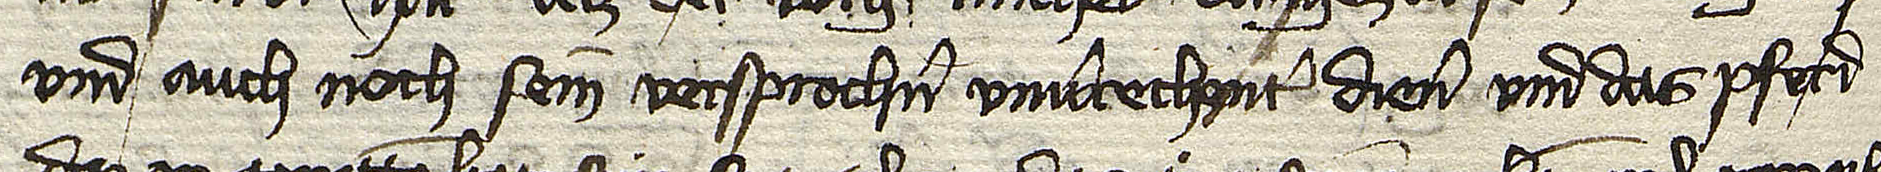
vnd auch noch ſein verſprochn* vnu*rechent* dien* vnd das pferd
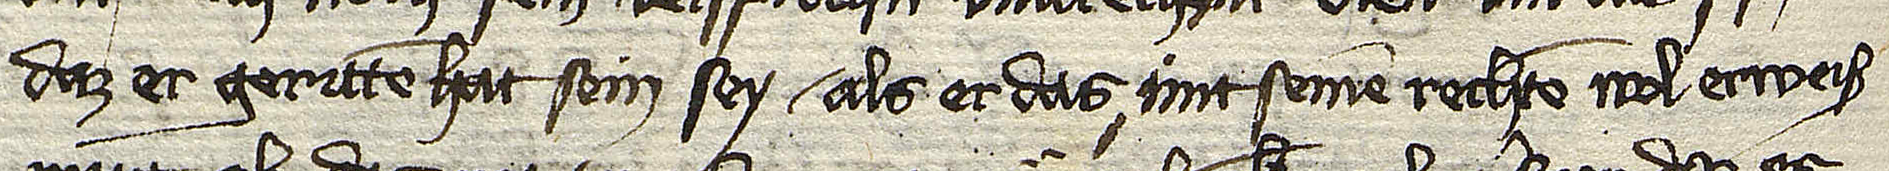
daʒ er geritte* hat ſein ſey / als er das mit ſeine* rechte* wol erweiſ*
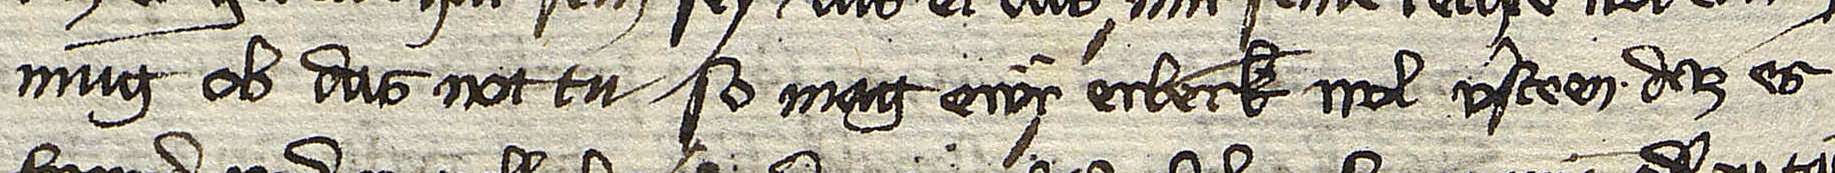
mug ob das not tu ſo mag eẅr erberk* wol v*ſteen . daʒ es
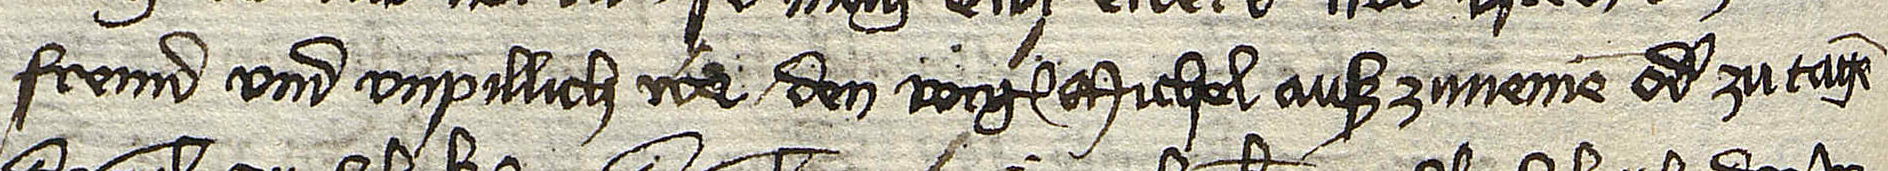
fremd vnd vnpillich we* / den vorg* Michel auſʒʒuneme od* ʒu tage*
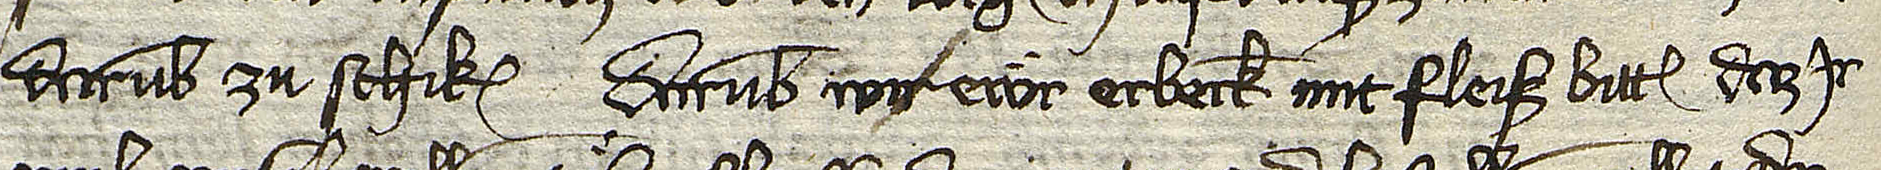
darub* ʒu ſchik* Darub* wir eẅr erberk* mit fleiſʒ bitt* daʒ Ir
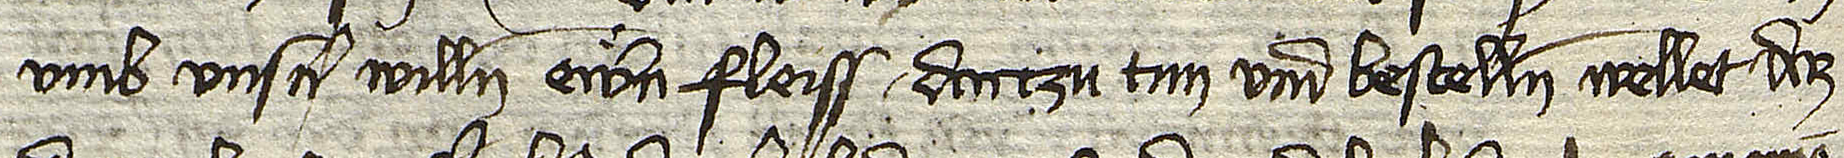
vmb vnſn* willn* eẅ*n fleiſſ / darcʒu tun vnd beſtelln* wellet / daʒ
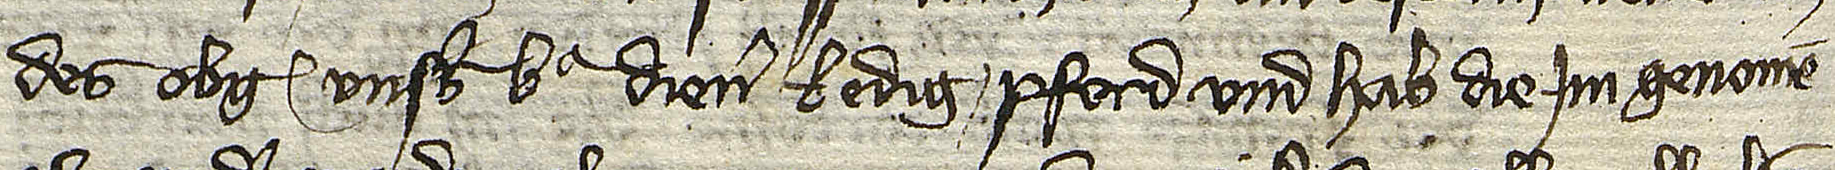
des obg* vnſ*s b* dien* ledig / pferd vnd hab die Im genome*
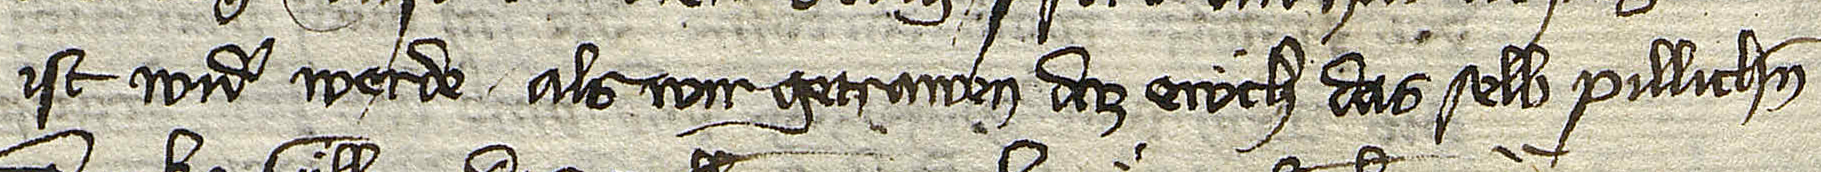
iſt wid* werde / als wir getrawen daʒ eẅch das ſelb pillichn*
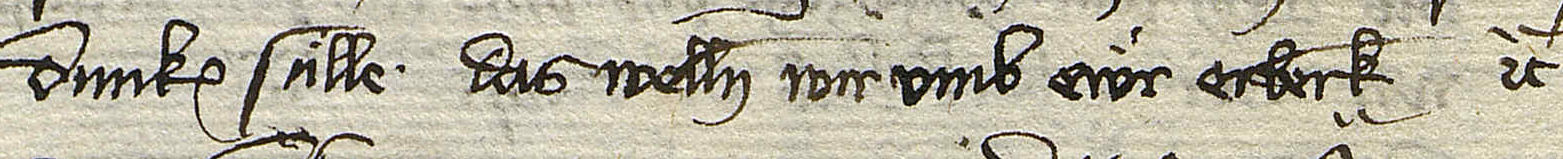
Dunk* ſülle . das welln* wir vmb eẅr erberk* ec*
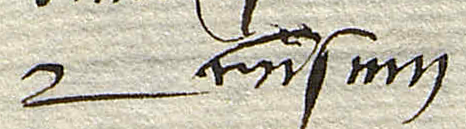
@ %%%%%
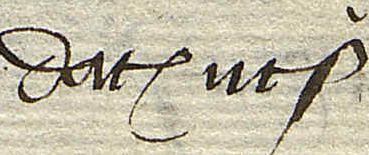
Dat* ut ſ*
